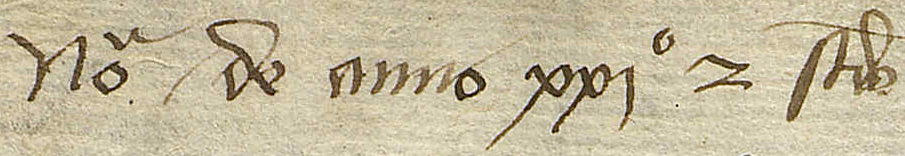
No* / de anno xxi* @ ſcdo*
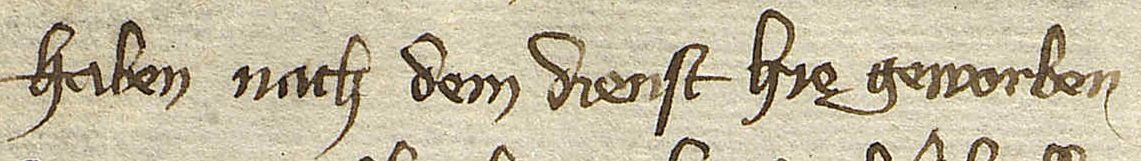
haben nach dem dienſt hie geworben
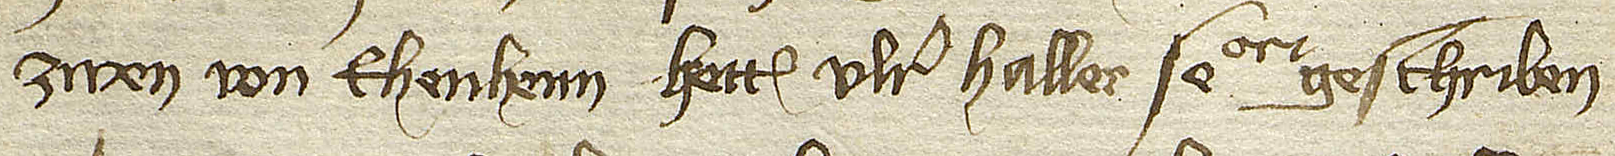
ʒwen von Ehenheim . hett* vlr* haller ſe* geſchriben
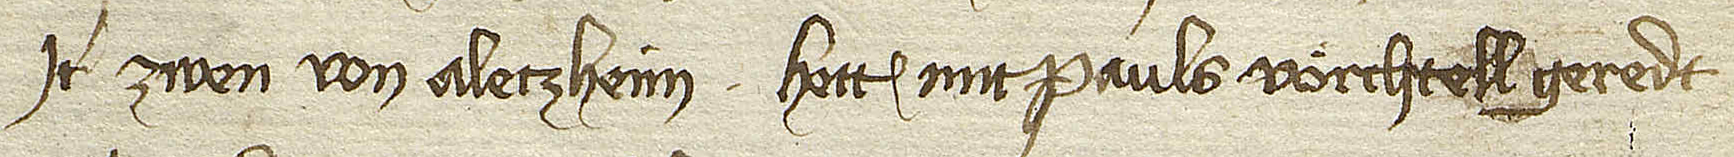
Ir* ʒwen von alecʒheim . hett* mit Pauls vörchtell geredt
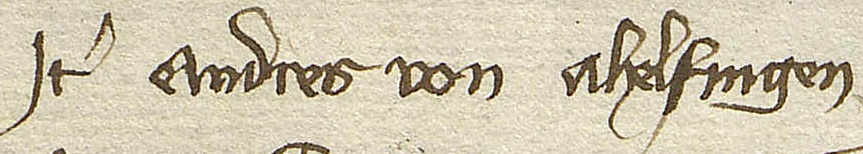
Ir* Andres von ahelfingen
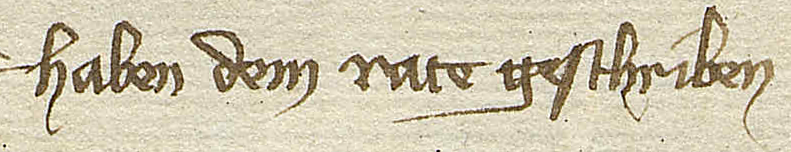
haben dem rate geſchriben
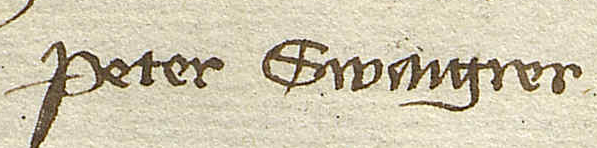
Peter Swaigrer
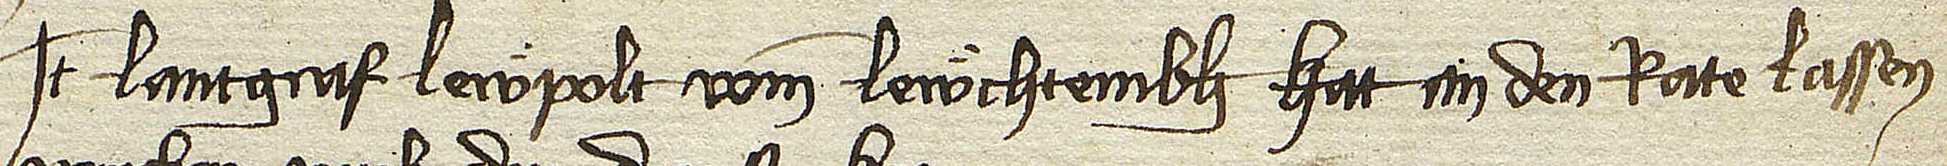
It* lantgraf leẅpolt vom* leẅchtemb*g hat in den Rate laſſen
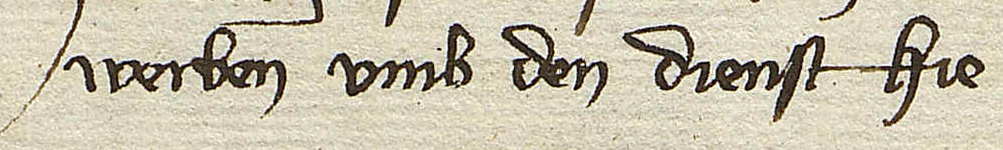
werben vmb den dienſt hie
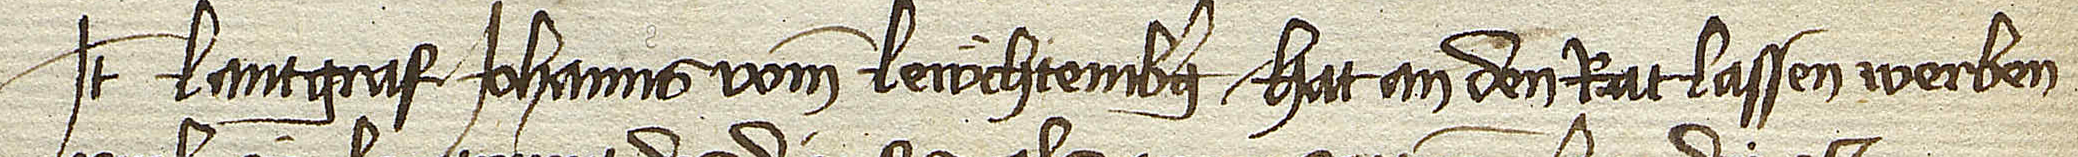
It* lantgraf Iohanns vom* leẅchtemb*g / hat an den Rat laſſen werben
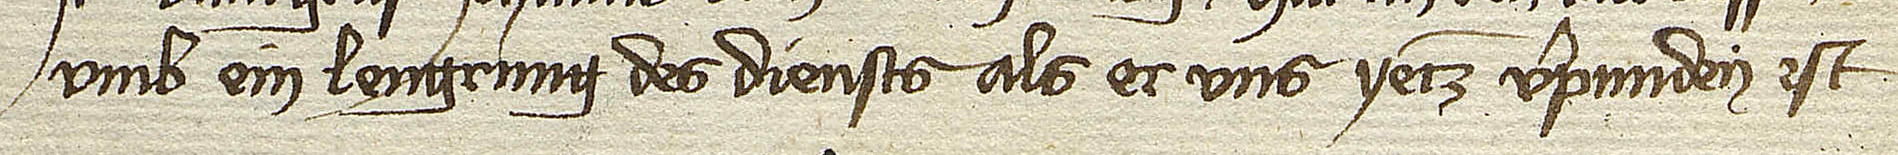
vmb ein lengrung des dienſts als er vns yecʒ* v*punden iſt
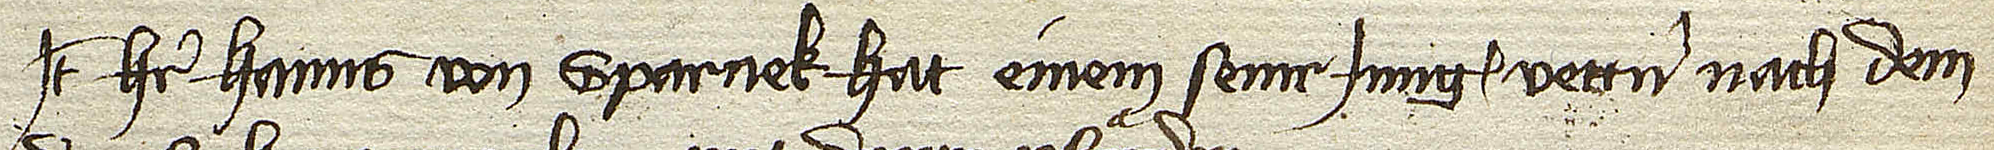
It* hr* hanns von Sparnek hat einem ſein*r Iung* vettn* nach dem
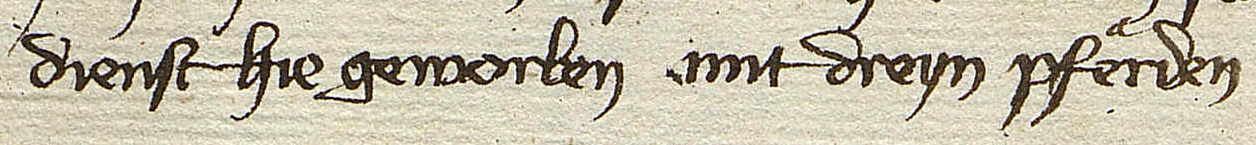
dienſt hie geworben mit dreyn pfërden
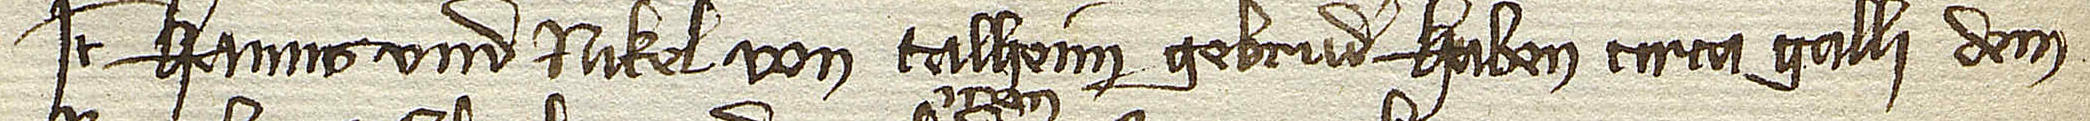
It* hanns vnd Nikel von talheim gebrud* haben circa galli dem
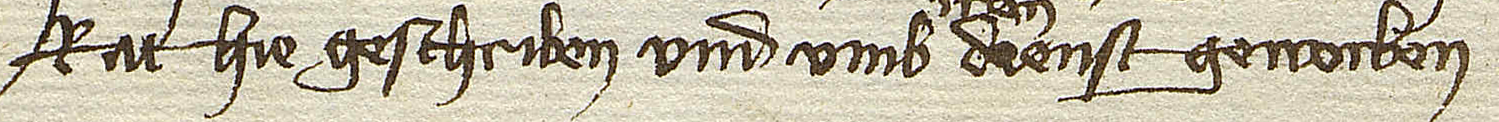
Rat hie geſchriben vnd vmb dienſt geworben
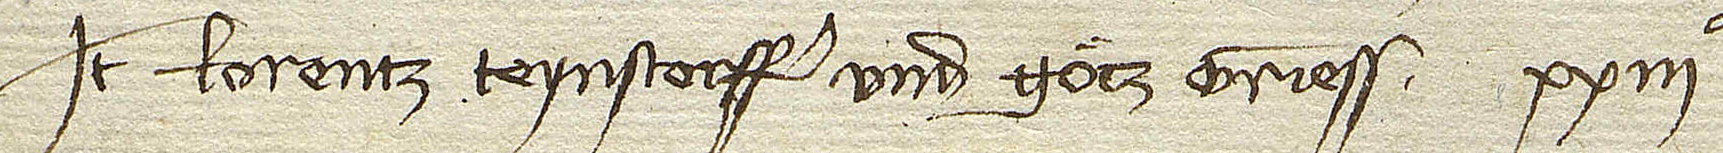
It* Lorencʒ teynſtorff* vnd göcʒ Grieſſ . xxiii*
